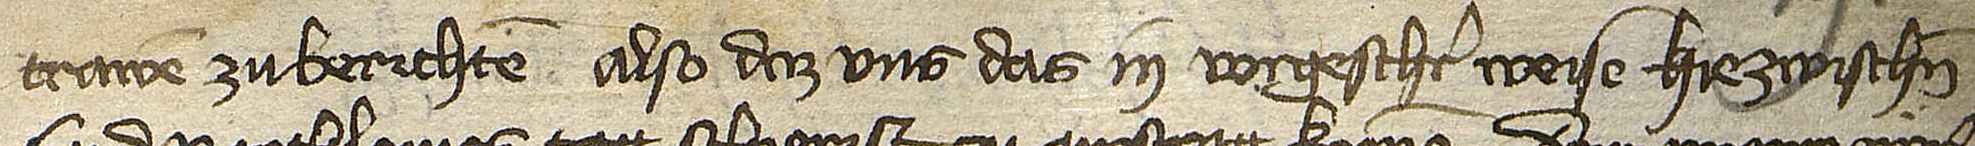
trawe* ʒu berichte* alſo daʒ vns das in vorgeſchr* weiſe hieʒwiſchn*
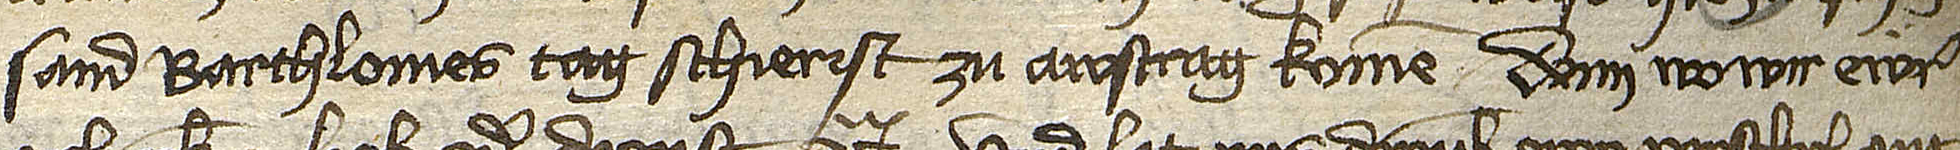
ſand Barthlomes tag ſchieriſt ʒu awſtrag kome* / Denn wo wir eẅr*
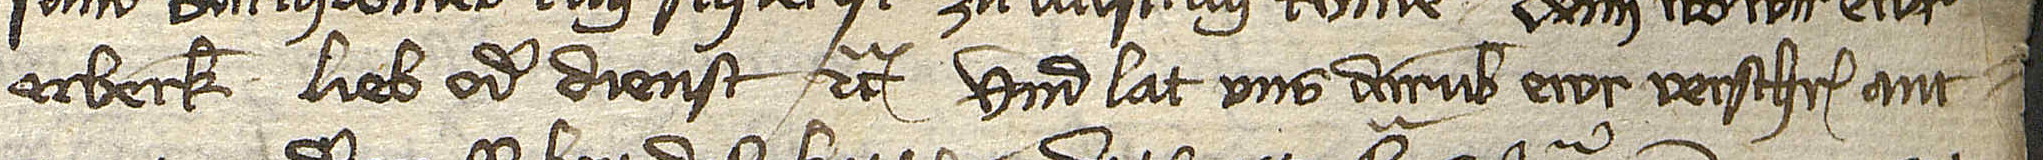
erberk* lieb od* dienſt ec* . Vnd lat vns darub* ewr verſchr* ant =
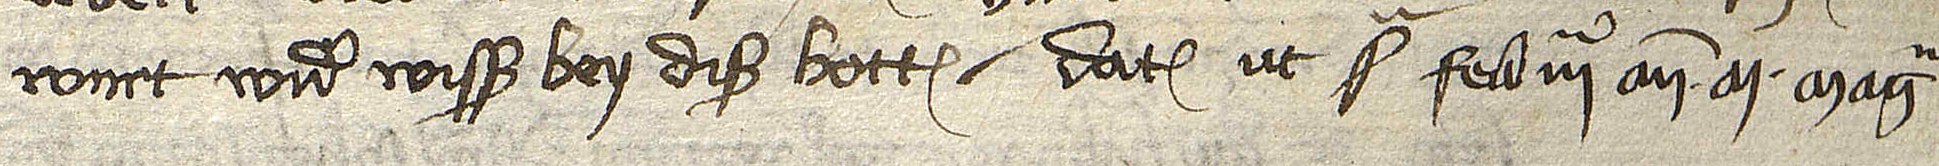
wurt wid* wiſſ* bey diſ* bott* / Dat* ut ſ* fe*a iii* an* M* Mag*
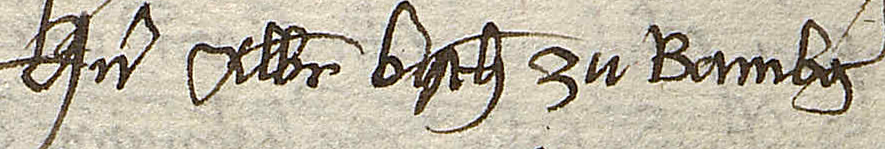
Hn* Albr* biſch* ʒu Bamb*g
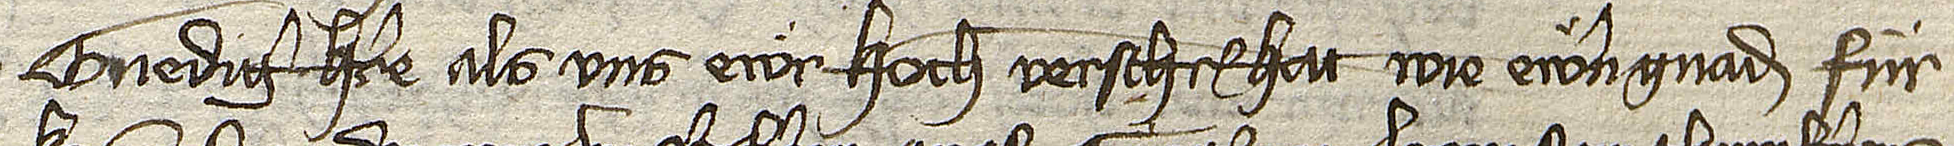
Gnedig* h*re als vns eẅr Hoch* verſchr* hat wie eẅ*n gnad* für
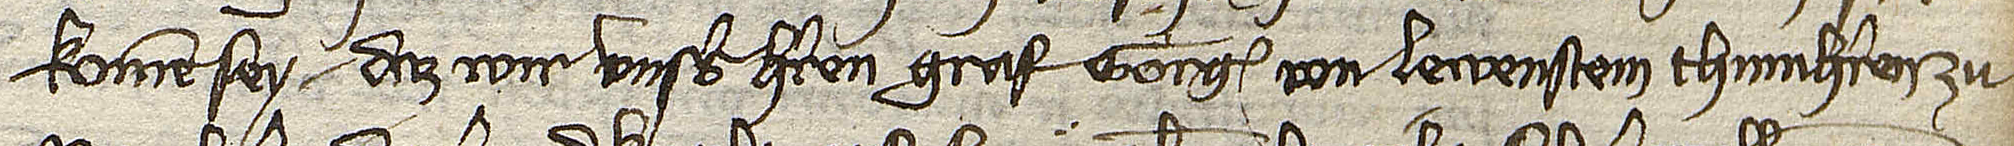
kome* ſey / daʒ wir vnſ*s h*ren graf Görg* von lewenſtein thumh*ren ʒu
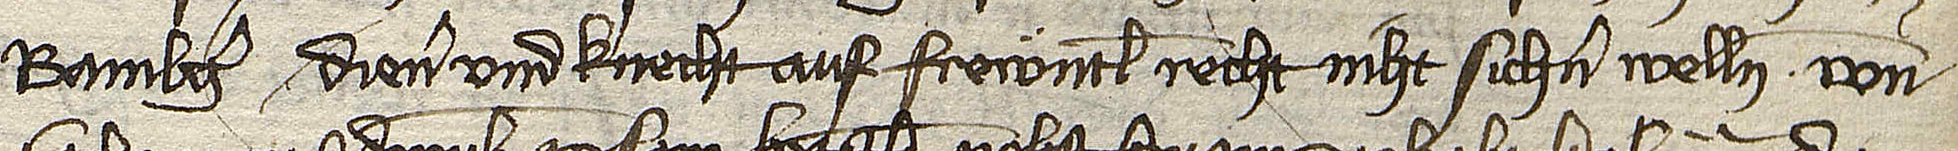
Bamb*g / dien* vnd knecht auf freẅntl* recht niht ſichn* welln* . von
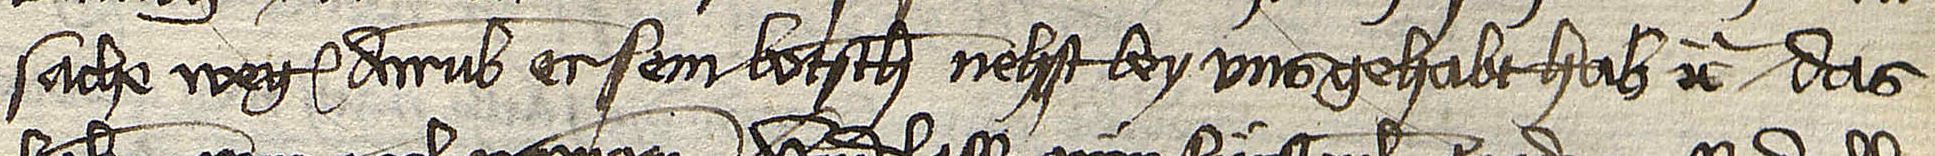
ſache weg* darub* er ſein botſch* nehſt bey vns gehabt ec* / Das
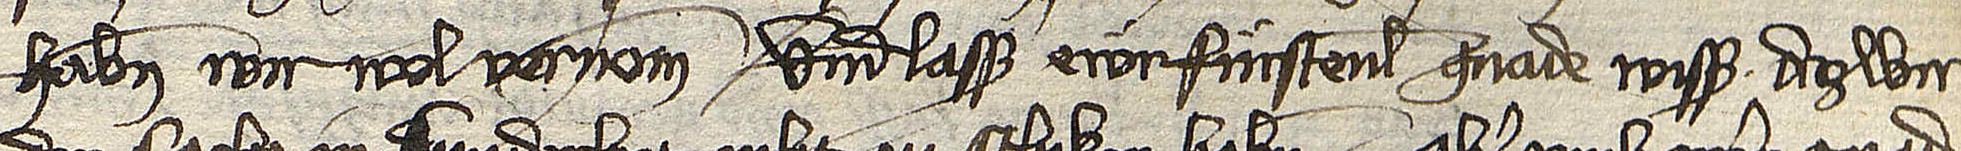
habn* wir wol vernom* / Vnd laſſ* eẅr fürſtenl* gnade wiſſ* . daʒ wir
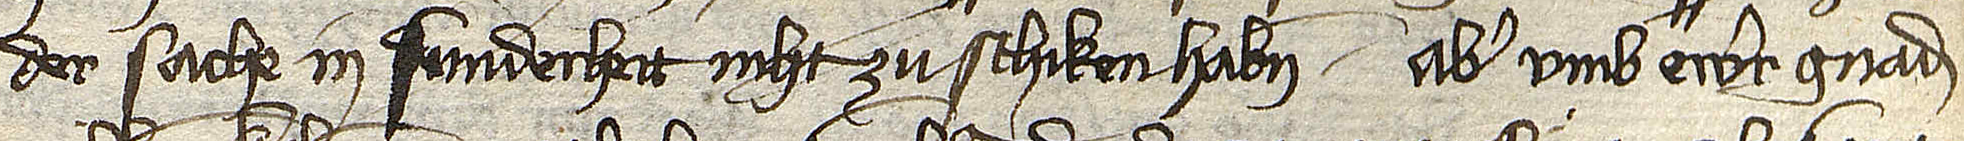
der ſache in ſunderheit niht ʒu ſchiken habn* / Ab* vmb ew*r gnad*
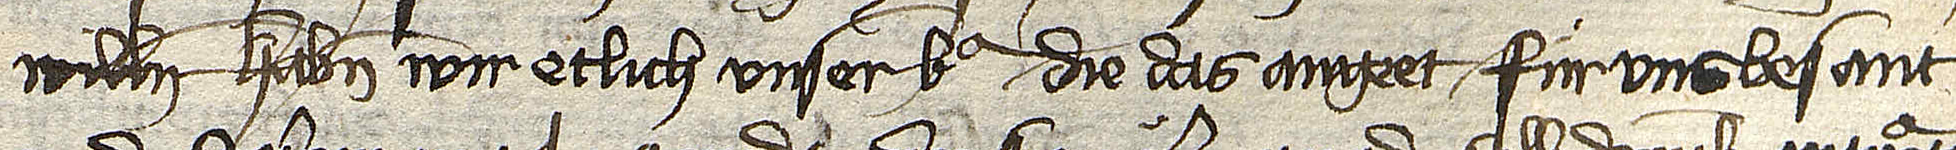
willn* habn* wir etlich vnſer b* / die das angeet / für vns beſant
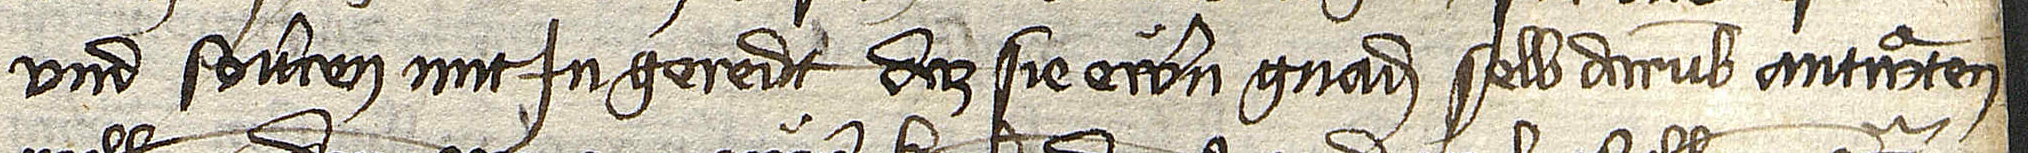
vnd ſou*ren mit In geredt daʒ ſie eẅ*n gnad* ſelb darub* antw*ten
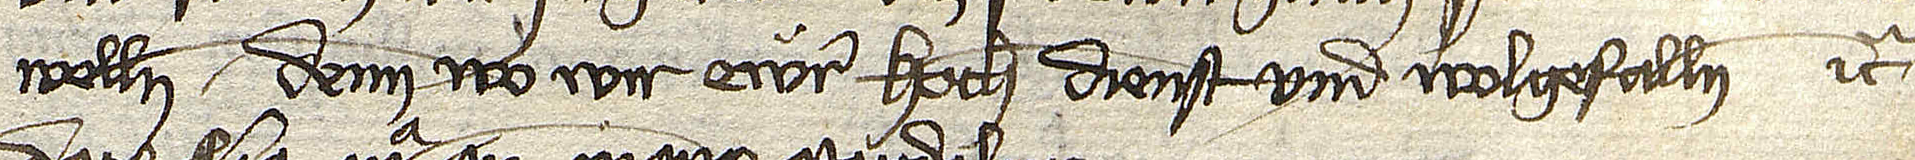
welln* / Denn wo wir eẅr* hoch* dienſt vnd wolgefalln* ec*
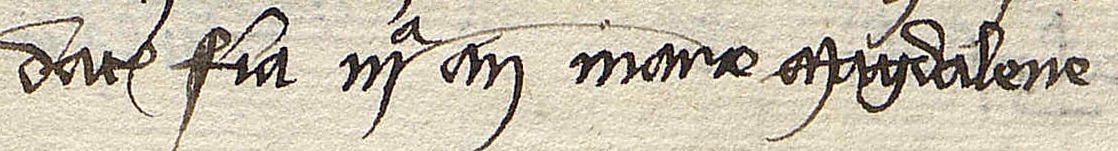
Dat* fi*a iii* an* marie Magdalene
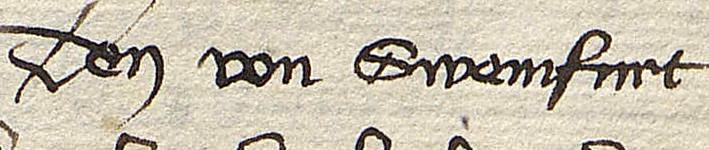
Den von Sweinfurt
